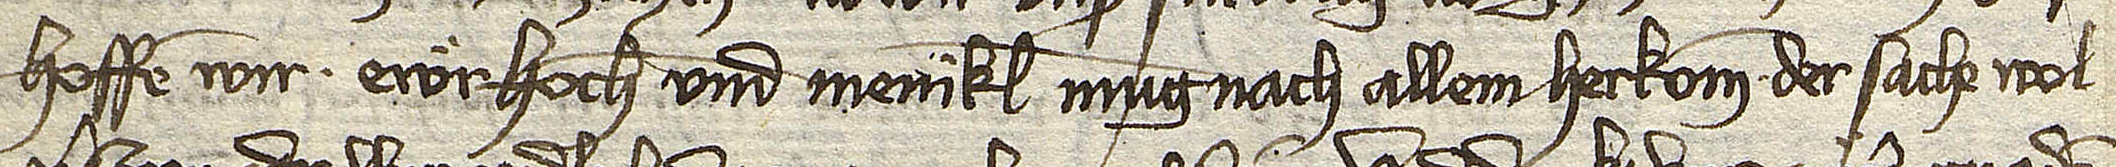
hoffe* wir . eẅr hoch* vns menikl* mug nach allem herkom* . der ſache wol
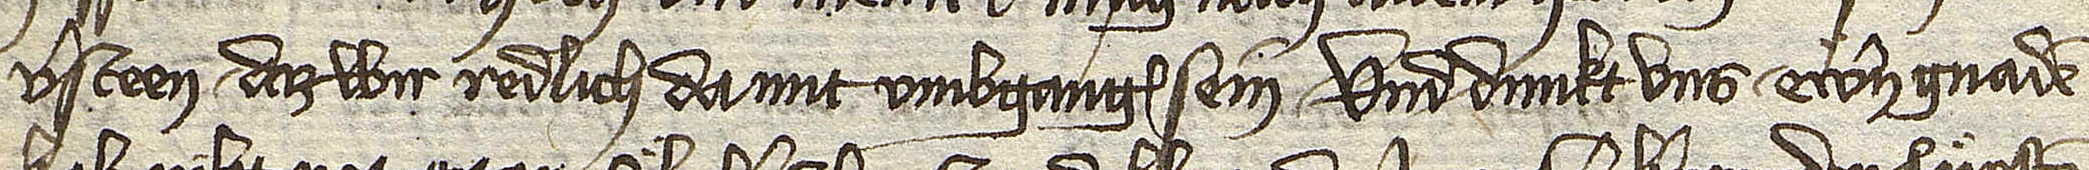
v*ſteen / daʒ wir redlich da mit vmbgang* ſein / Vnd dunkt vns / eẅ*n gnade*
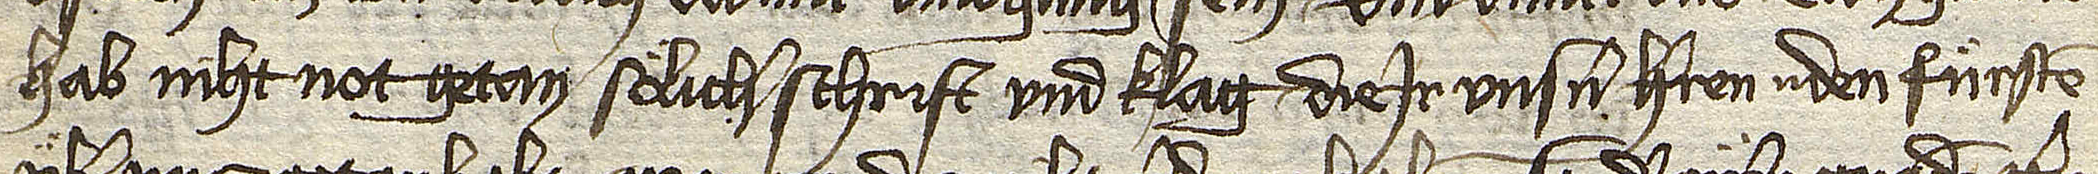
hab niht not getan ſölich* ſchrift vnd klag / die Ir vnſn* h*ren ~ den fürſte*
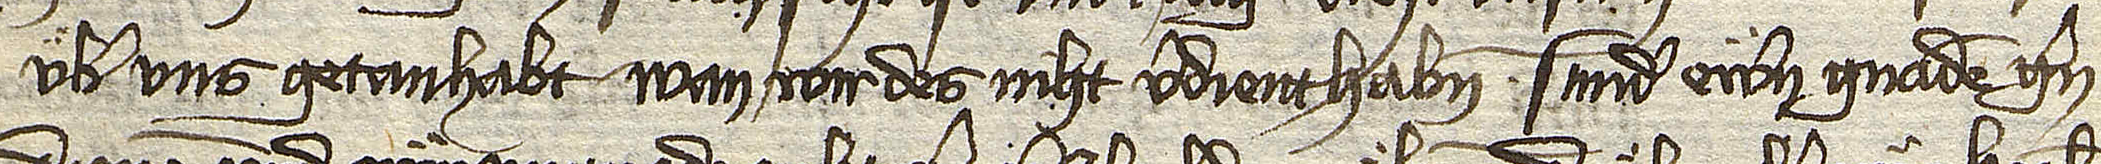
v̈b* vns getan habt / wan wir des niht v*dient habn* ſund* eẅ*n gnade* g*n
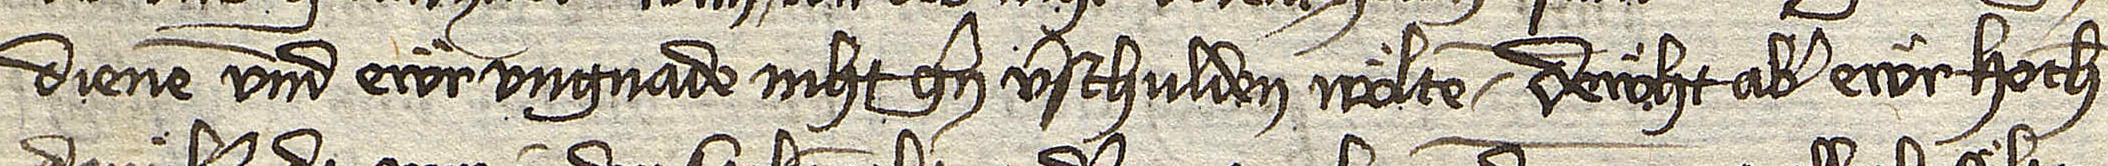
diene* vnd eẅr vngnade niht g*n v*ſchulden wölte* / Deẅht ab* eẅr hoch*
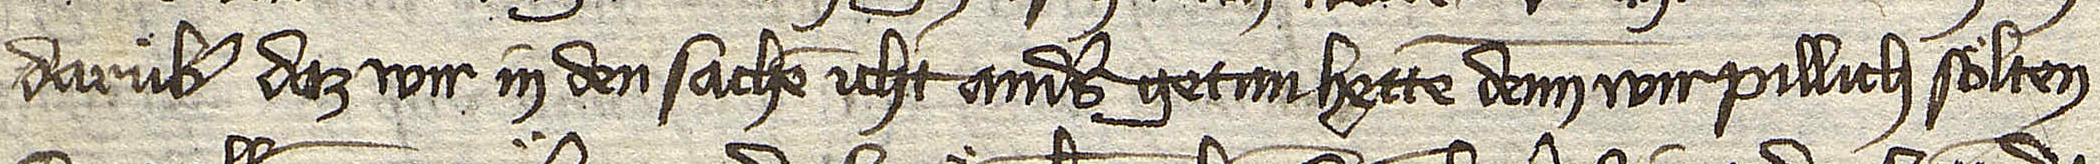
darüb* daʒ wir in den ſache* icht and*s getan hette* denn wir pillich ſölten
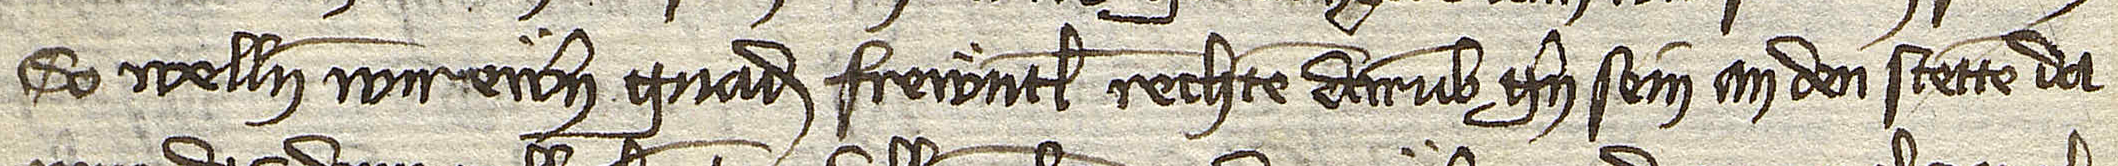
So welln* wir eẅ*n gnad* freẅntl* rechte* darub* g*n ſein an den ſtette* da
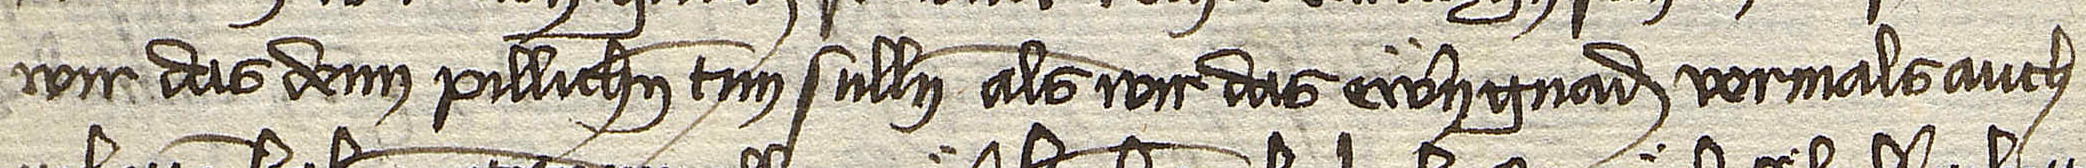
wir das denn pillichn* tun ſulln* als wir das eẅ*n gnad* vormals auch
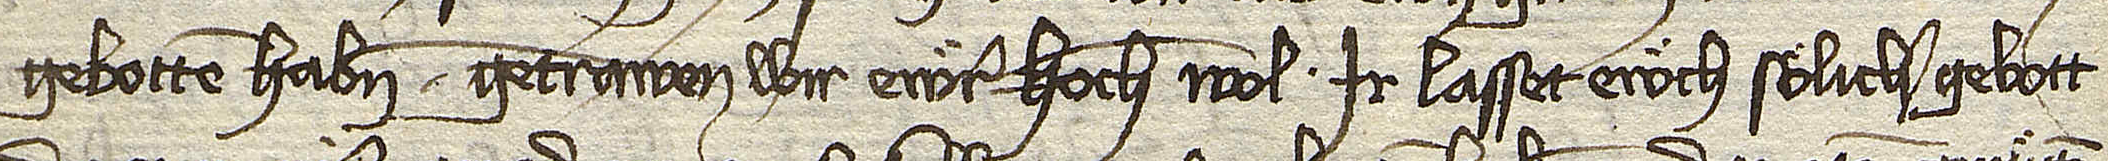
gebotte* habn* / getrawen wir eẅr* hoch* wol . Ir laſſet eẅch ſölich* gebott
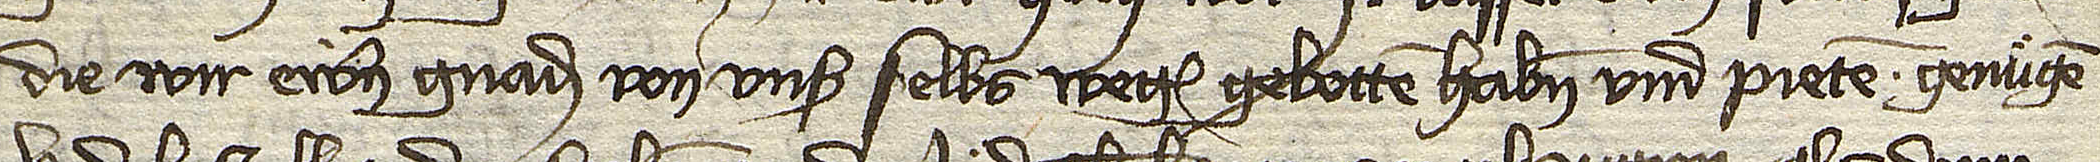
die wir eẅ*n gnad* von vnſ* ſelbs weg* gebotte* habn* vnd piete* . genüge*
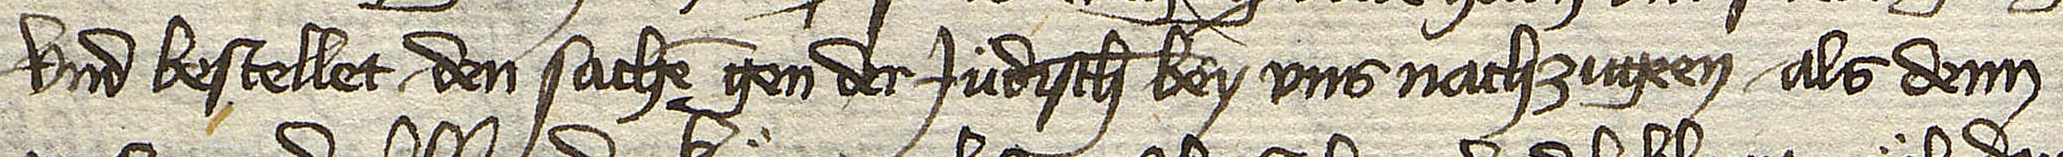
Vnd beſtellet / den ſache* gen der Iüdiſch* bey vns nachʒugeen / als denn
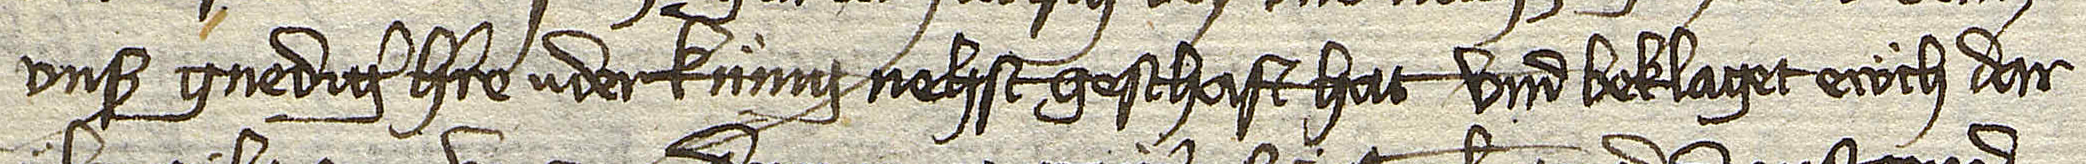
vnſ* gnedig* h*re ~ der künig nehſt geſchaft hat Vnd beklaget eẅch dar
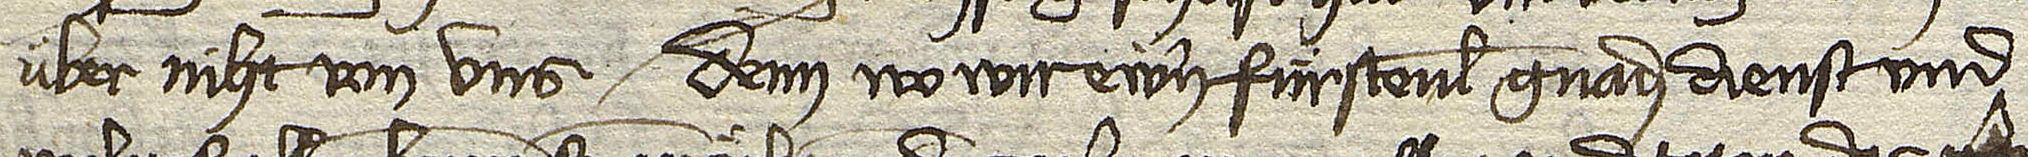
über niht von vns / Denn wo wir eẅ*n fürſtenl* gnad* dienſt vnd
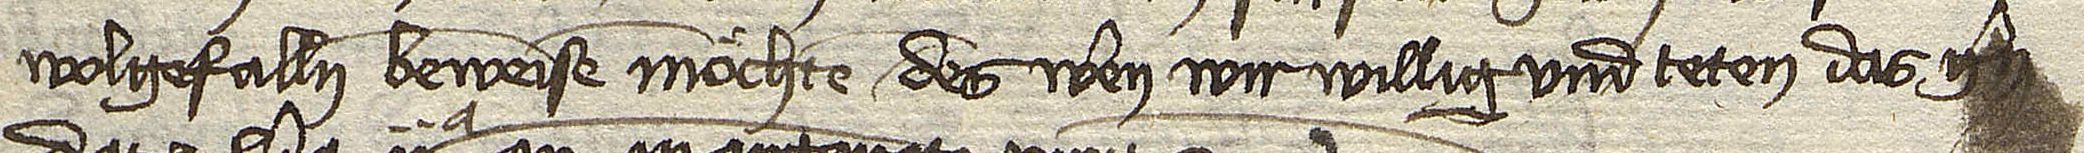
wolgefalln* beweiſe* möchte* / des w*en wir willig vnd teten das g*n
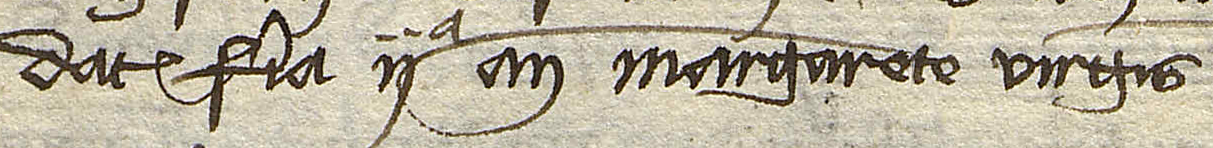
Dat* fi*a ii* an* margarete virgi*s
